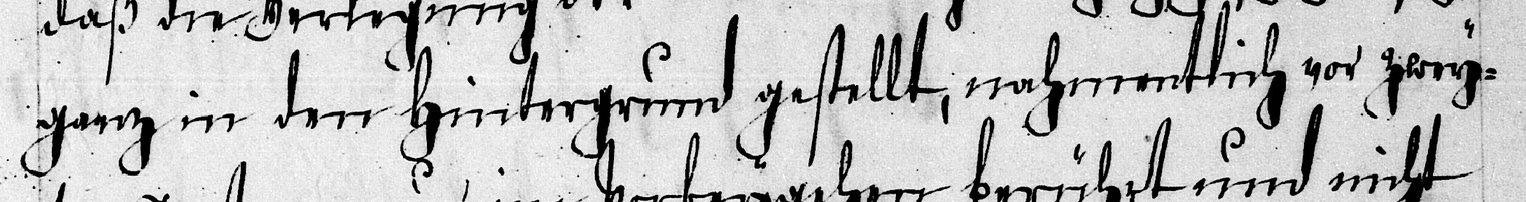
ganz in den Hintergrund gestellt, nahmentlich vor zwey¬
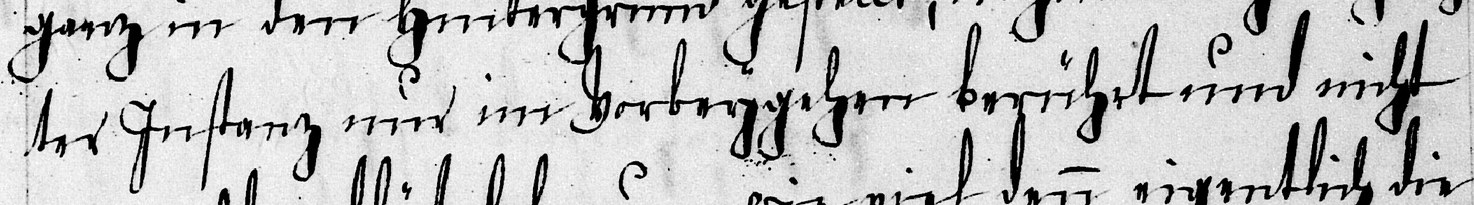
ter Instanz nur im Vorbeygehen berührt und nicht
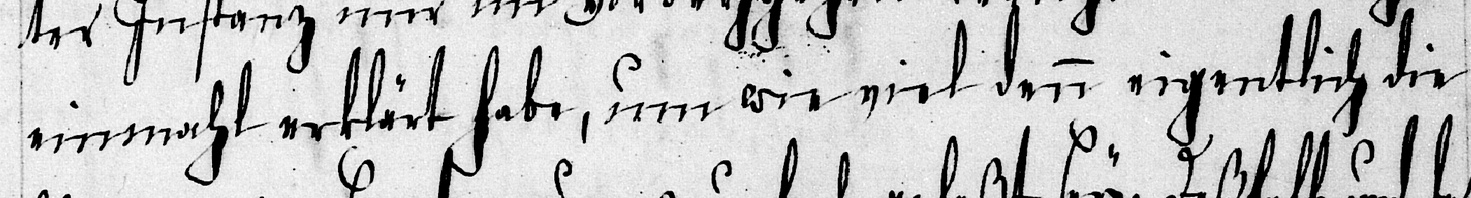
einmahl erklärt habe, um wie viel denn eigentlich die
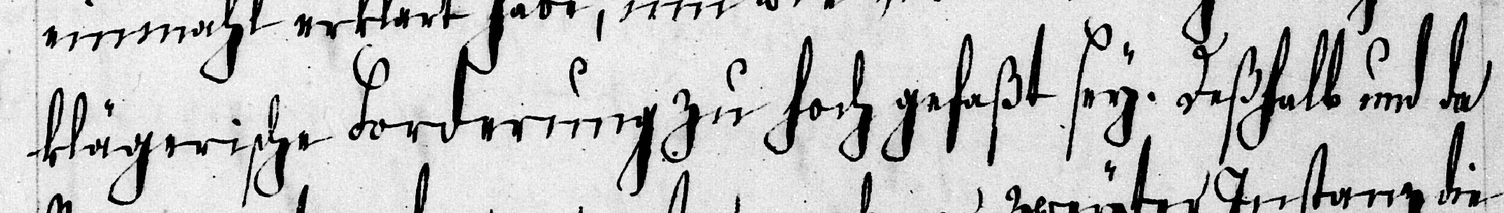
klägerische Forderung zu hoch gefaßt sey. Deßhalb und da
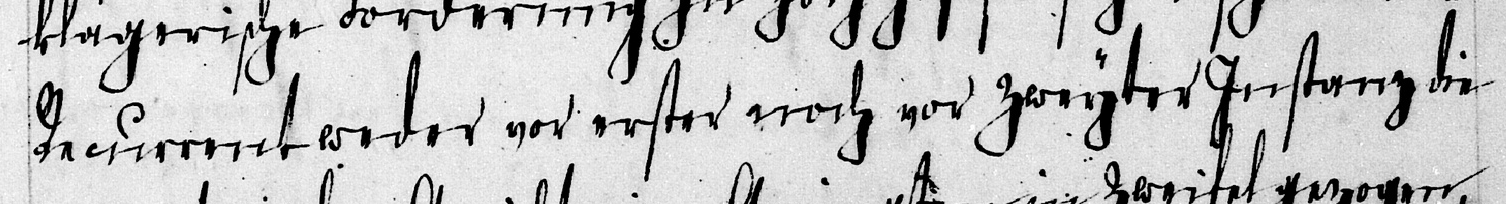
Recurrent weder vor erster noch vor zweyter Instanz die
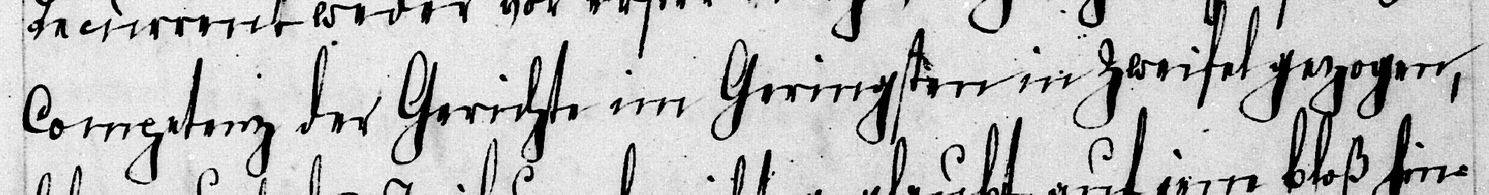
Competenz der Gerichte im Geringsten in Zweifel gezogen,
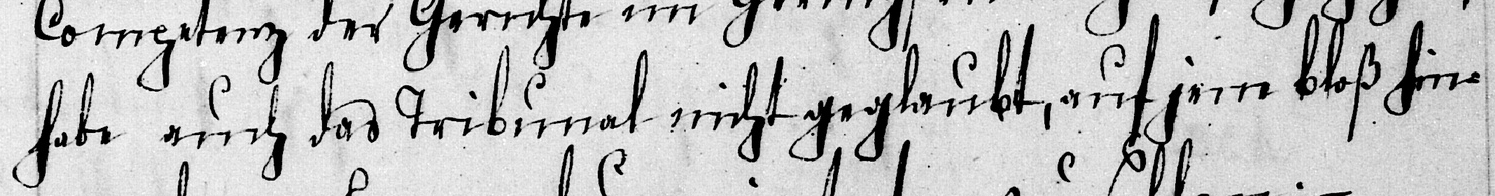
habe auch das Tribunal nicht geglaubt, auf jene bloß hin¬
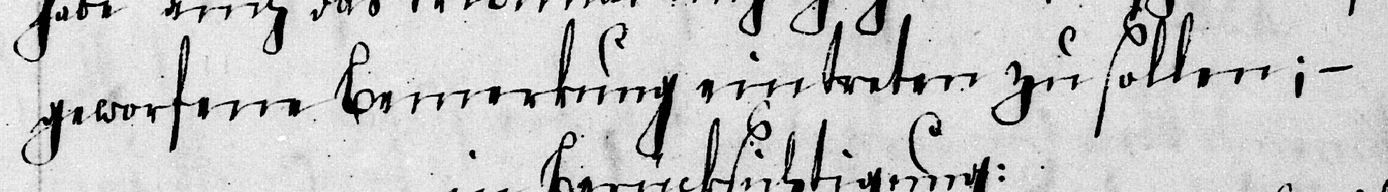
geworfene Bemerkung eintreten zu sollen; –
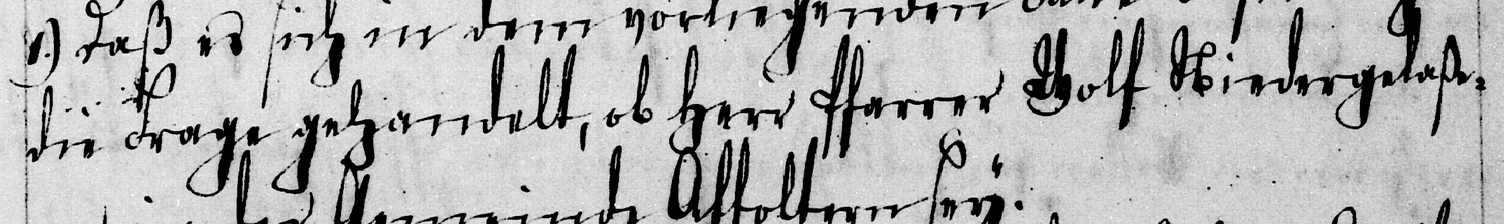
die Frage gehandelt, ob Herr Pfarrer Wolf Niedergelaße¬
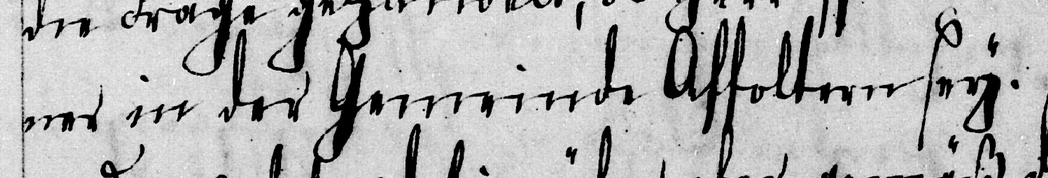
ner in der Gemeinde Affoltern sey.
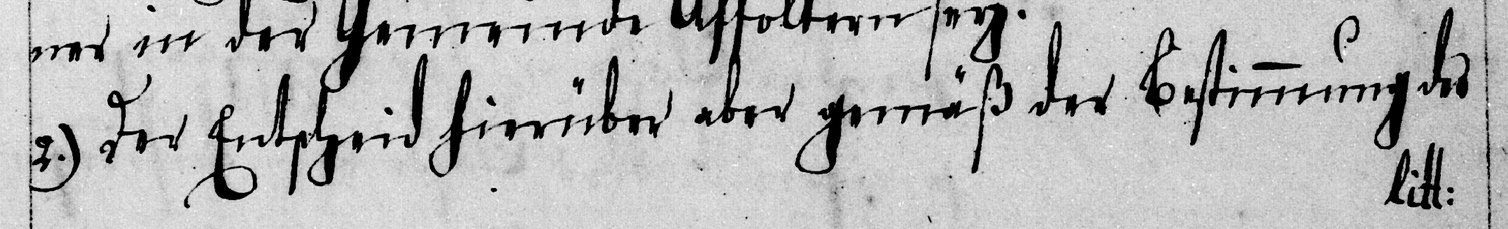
2.) Der Entscheid hierüber aber gemäß der Bestimmung des
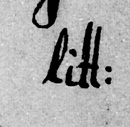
lla¬
